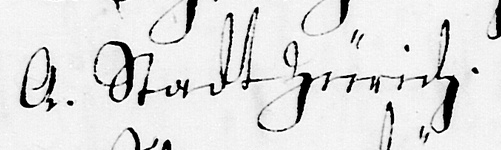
A. Stadt Zürich.
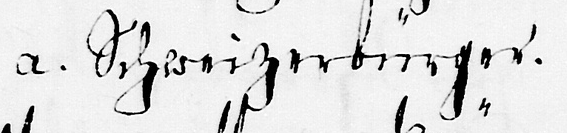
a. Schweizerbürger.
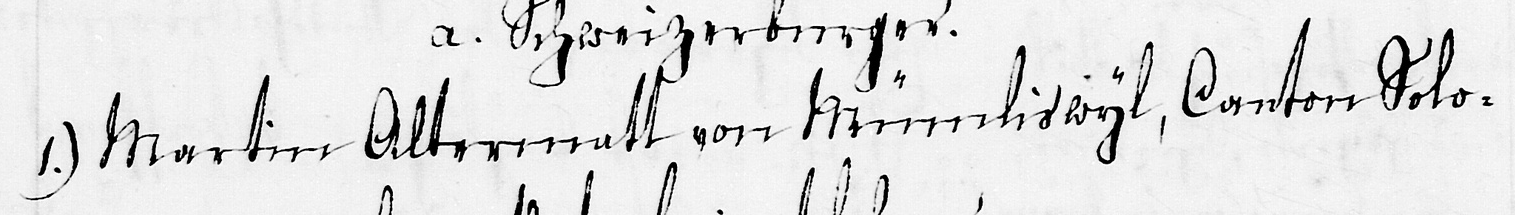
1.) Martin Altermatt von Mümliswyl, Canton Solo¬
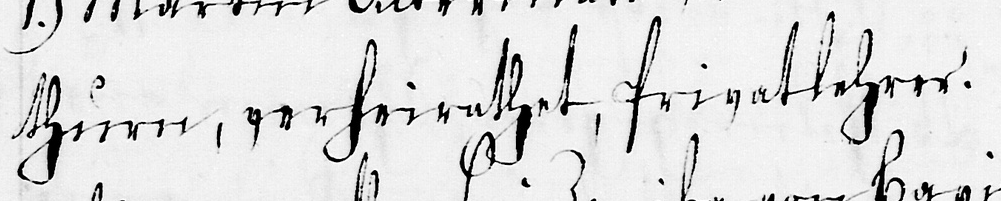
thurn, verheirathet, Privatlehrer.
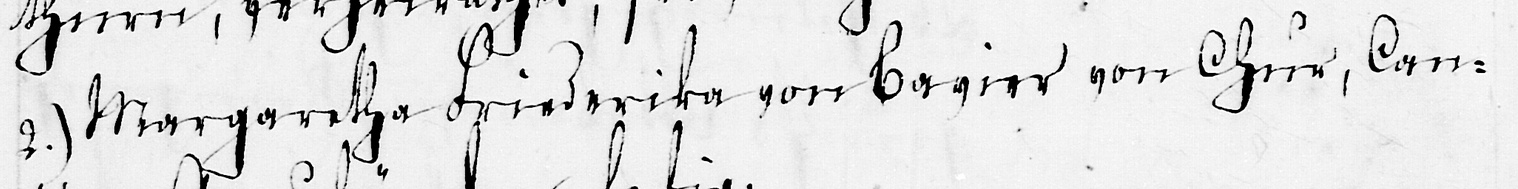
2.) Margaretha Friederika von Bavier von Chur, Can¬
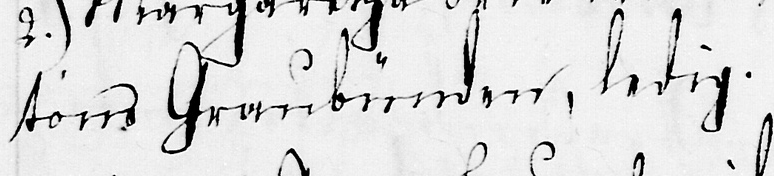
tons Graubünden, ledig.
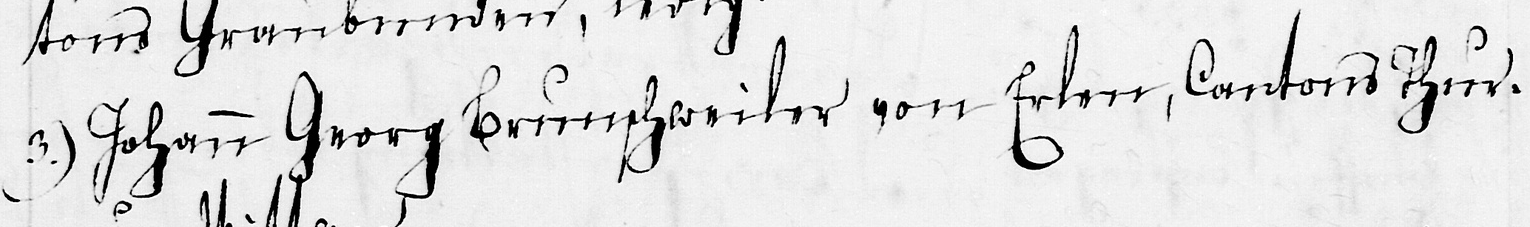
3.) Johann Georg Brunschweiler von Erlen, Cantons Thur¬
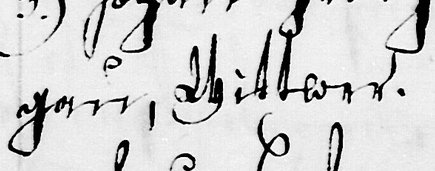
gau, Wittwer.
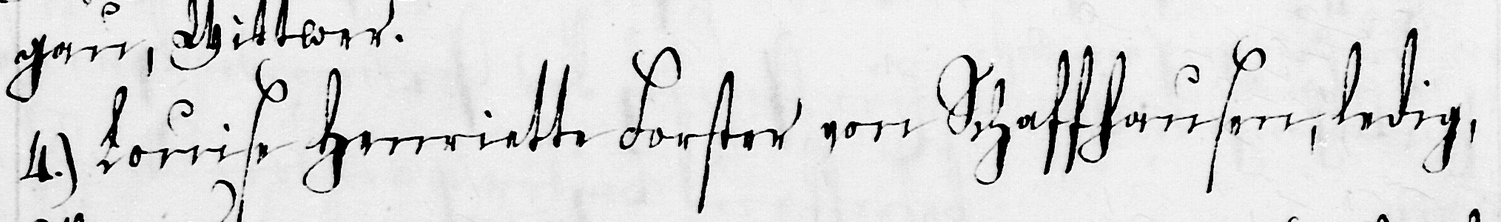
4.) Louise Henriette Forster von Schaffhausen, ledig,
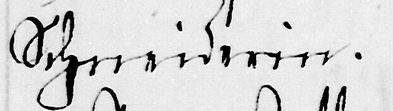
Schneiderin.
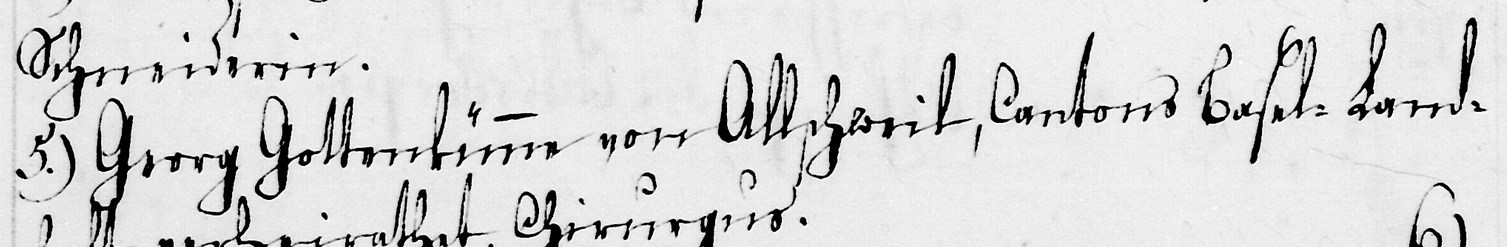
5.) Georg Gottenkünne von Allschweil, Cantons Basel-Land¬
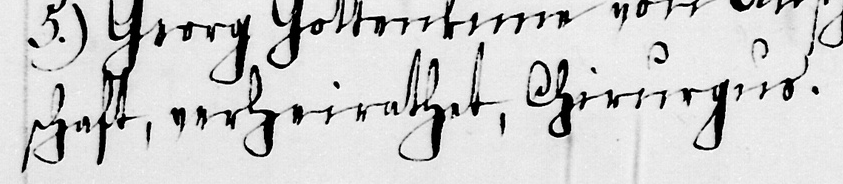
schaft, verheirathet, Chirurgus.
